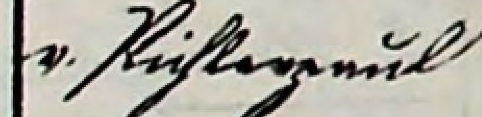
v. Pichlerpaul
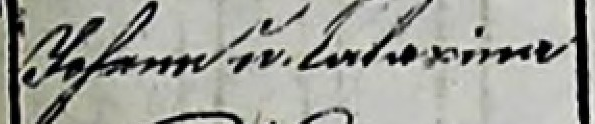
Johann u. Catarina
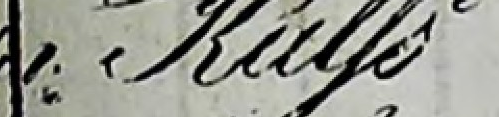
Kalss
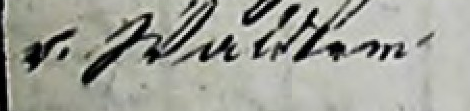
v. Waldter
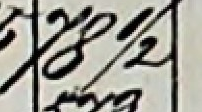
78 1/2
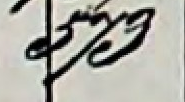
573
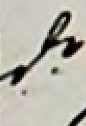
Do
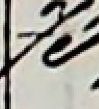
75
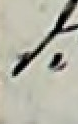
Do
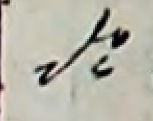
Do
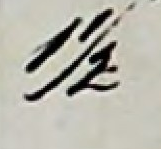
1 1/2
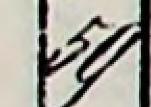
59
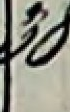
38
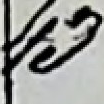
43
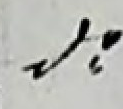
Do
